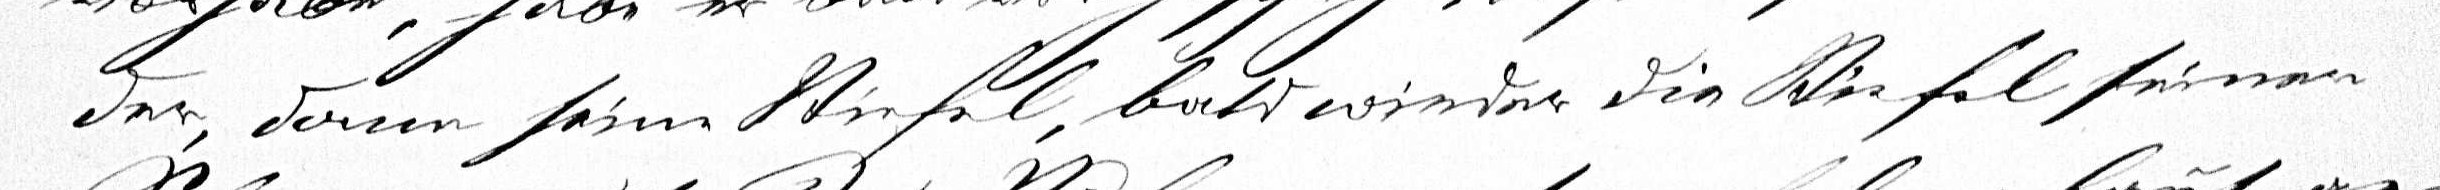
der, dann seine Stiefel, bald wieder die Stiefel seinen
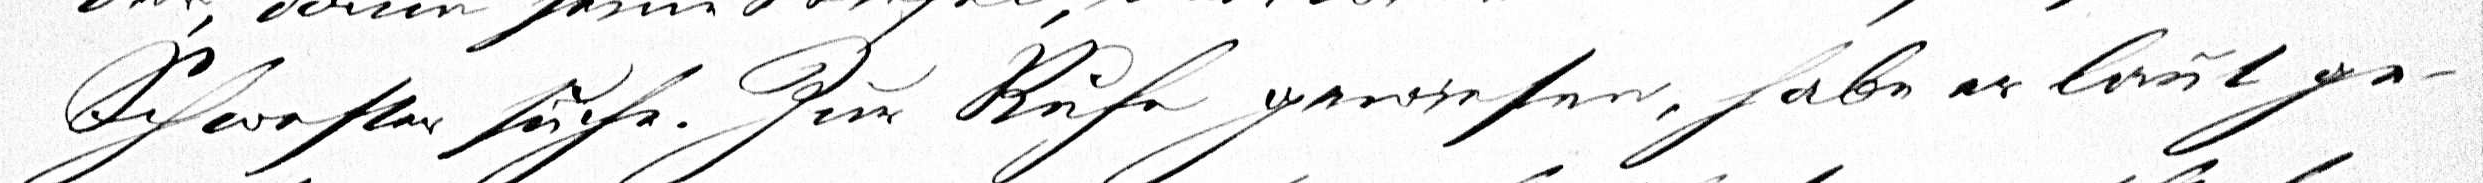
Schwester suche. Zur Ruhe gewiesen, habe er laut ge¬
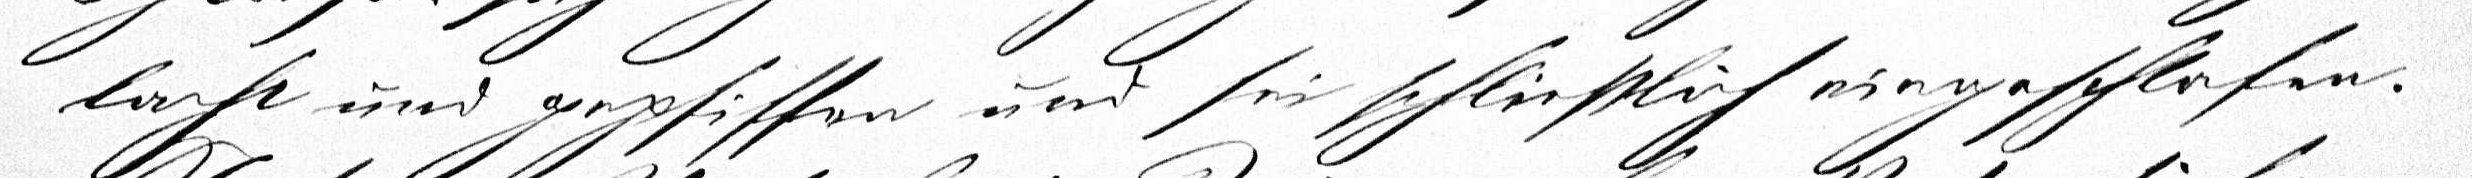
lacht und gexx und sein schließlich eingeschlafen.
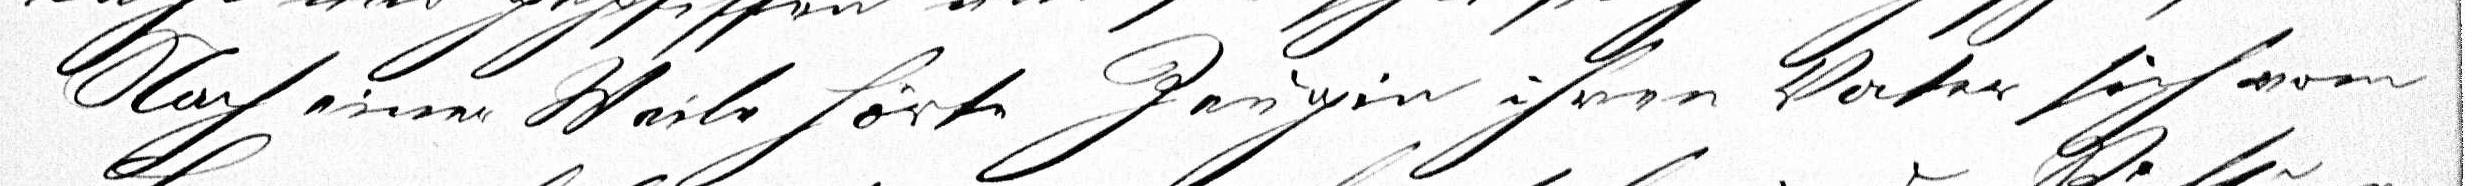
Nach einer Weile hörte Zeugin ihren Vater sich vom
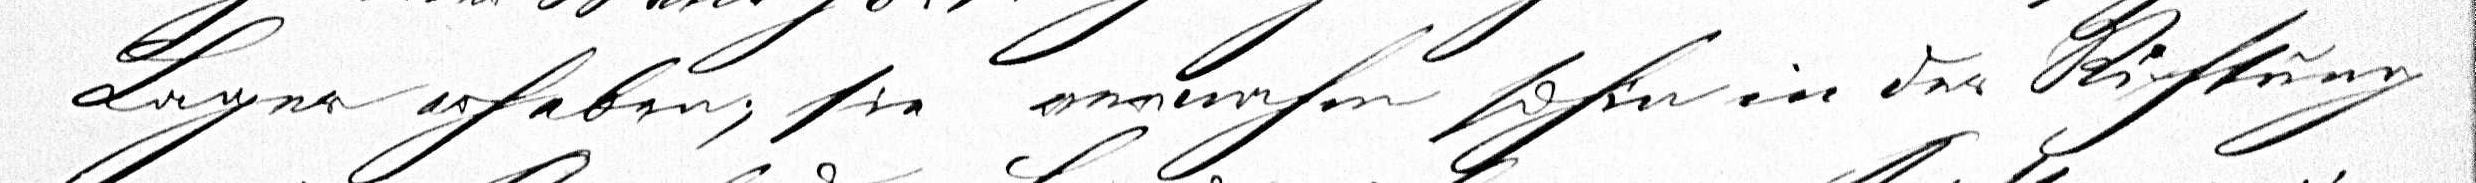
Lager erheben; sie vernahm sohin in der Richtung
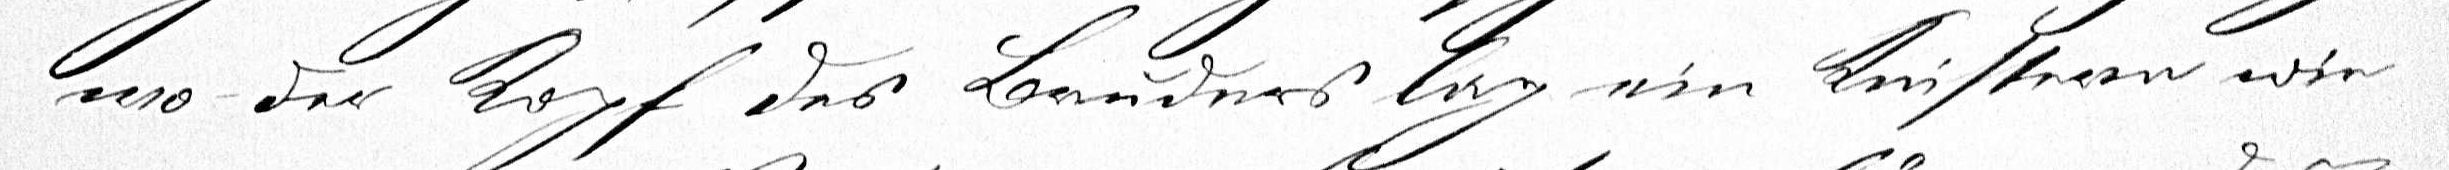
wo der Kopf des Bruders lag ein Knistern wie
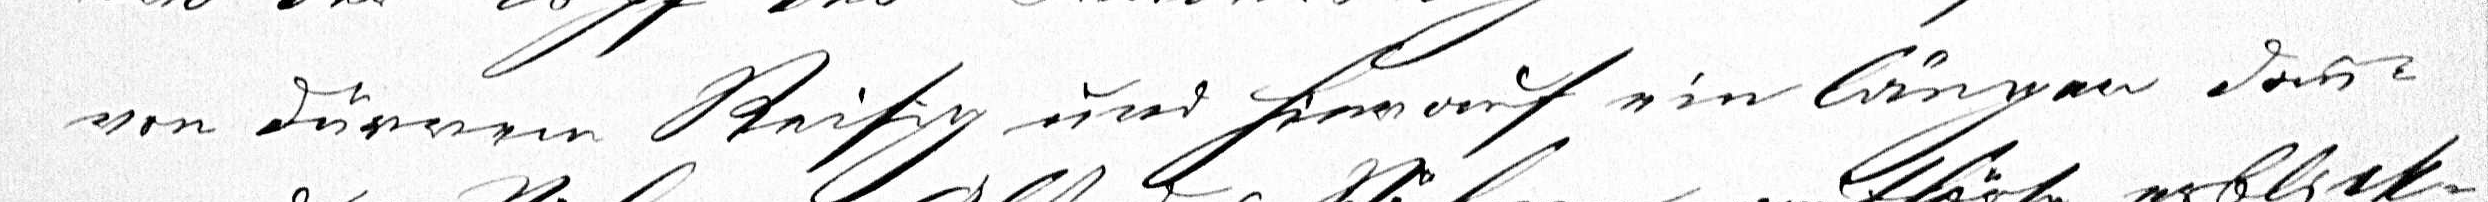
von dürrem Reisig und hinrauf ein längen dau¬
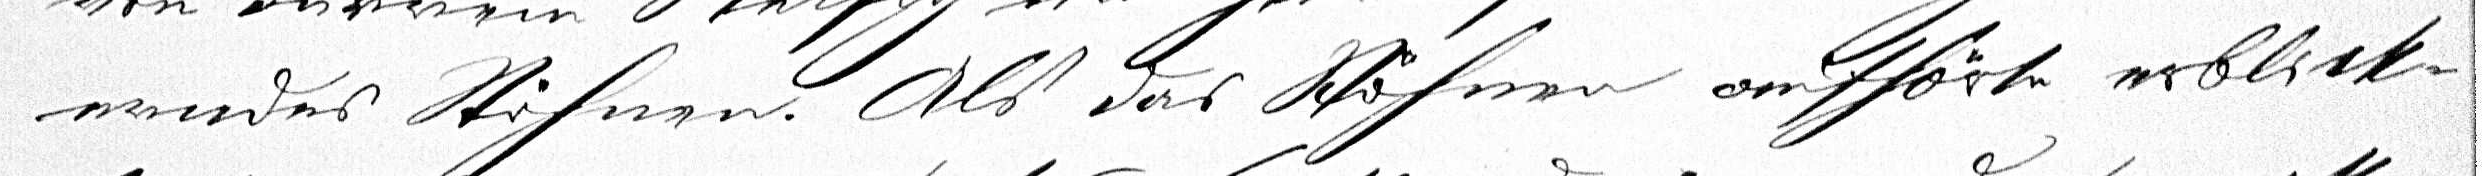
erndes Stöhnen. Als das Stöhnen aufhörte erblick¬
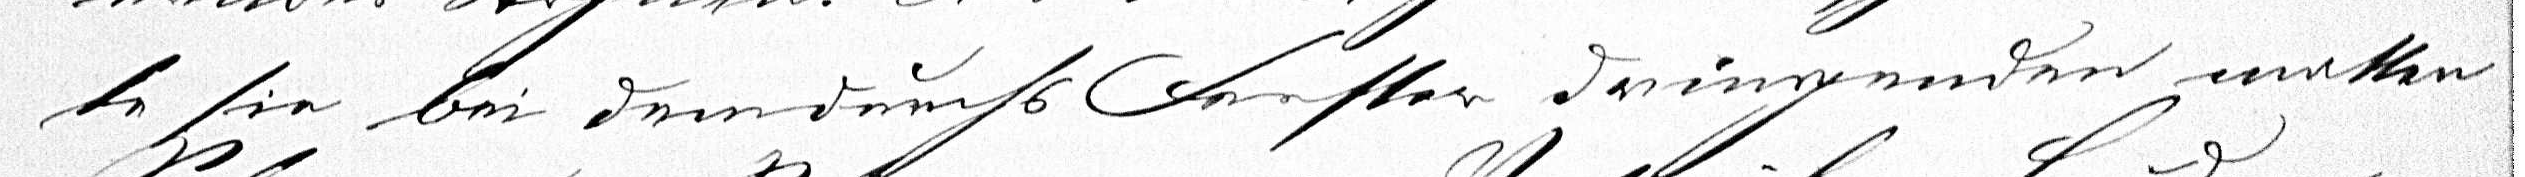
te sie bei dem durchs Fenster dringenden matten
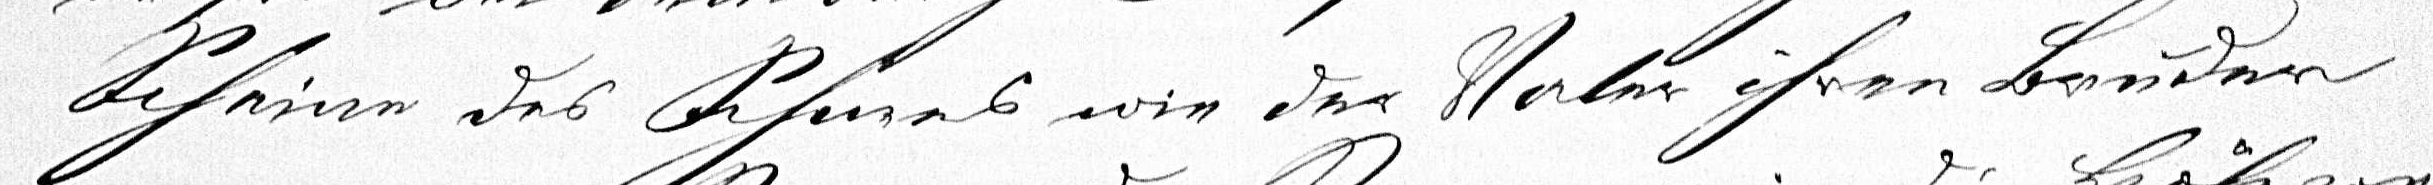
Scheine des Schxx wie der Vater ihren Bruder
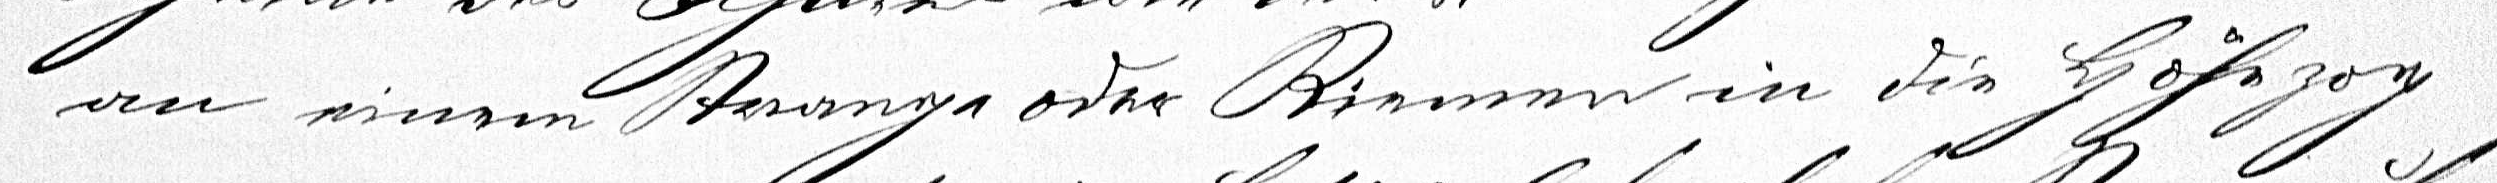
an einem Strange oder Riemen in die Höhe zog
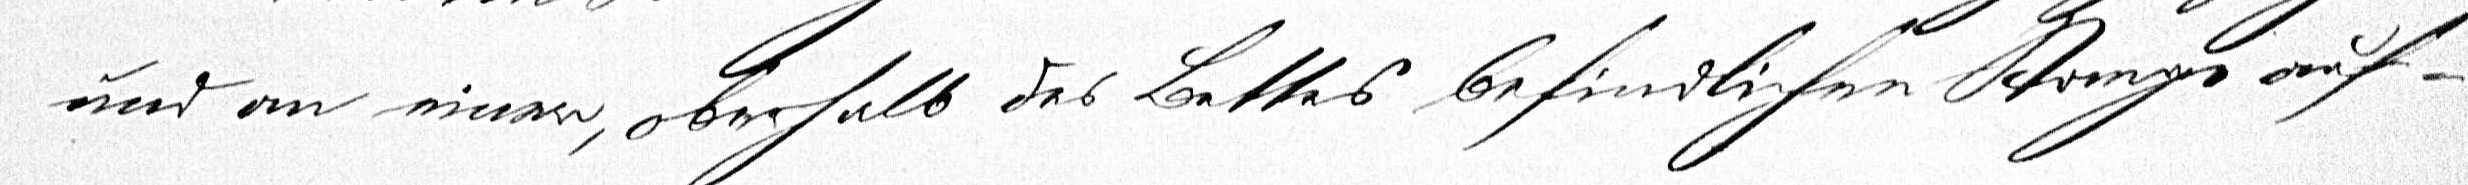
und an einer, oberhalb des Bettes befindlichen Stange auf¬
